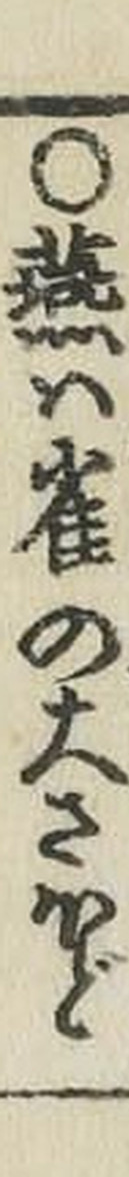○燕は雀の大さほど
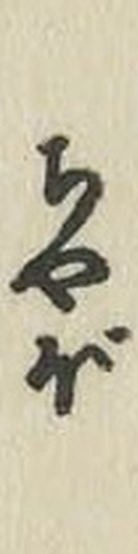ちやぼ
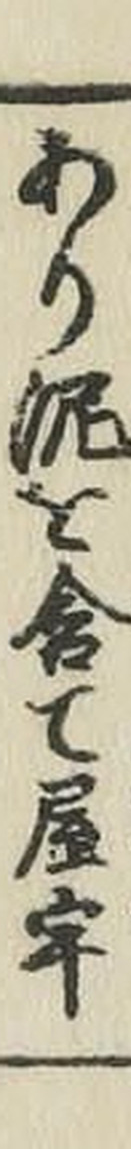あり泥を含て屋宇
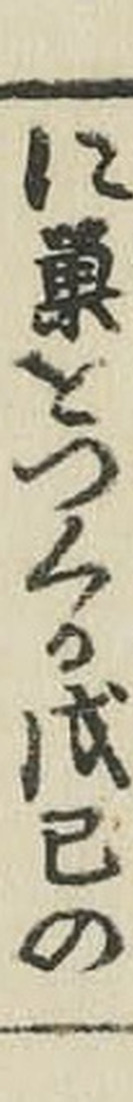に巣をつくる戊巳の
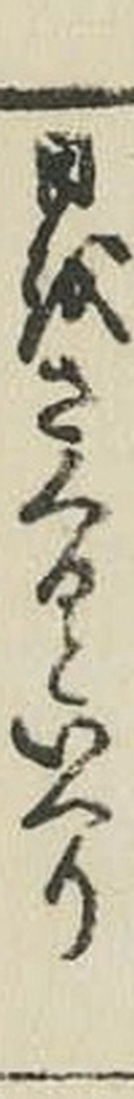日をさくるといへり
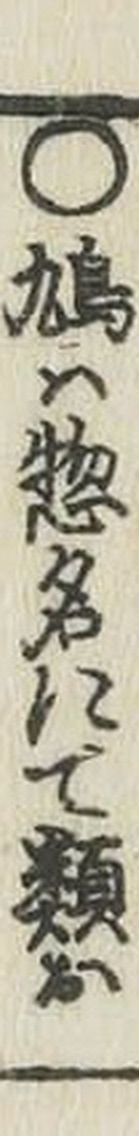○鳩は惣名にて類お
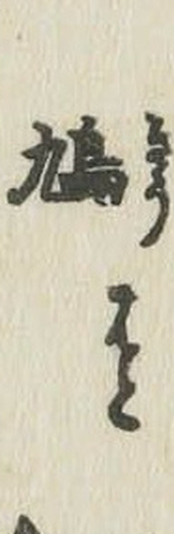鳩はと
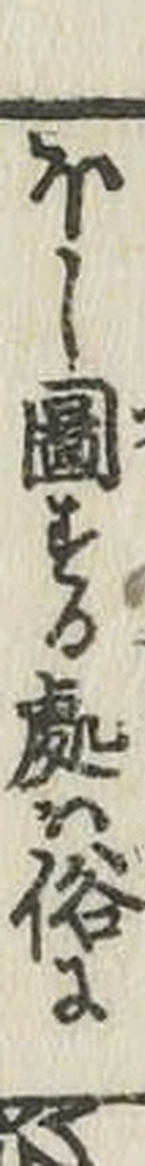ほし図する処は俗に
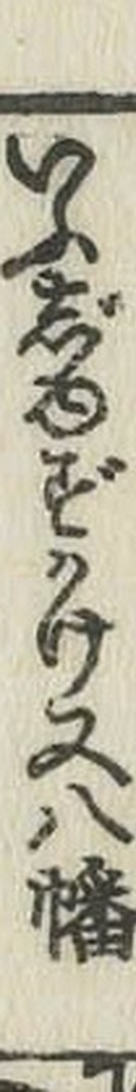いふじゆずかけ又八幡
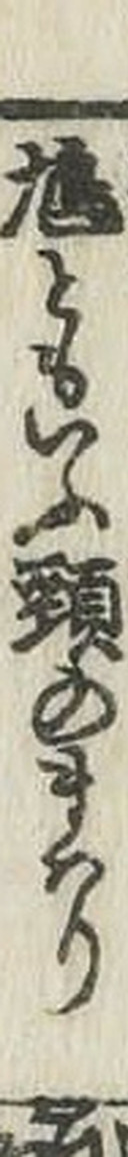鳩ともいふ頸のまはり
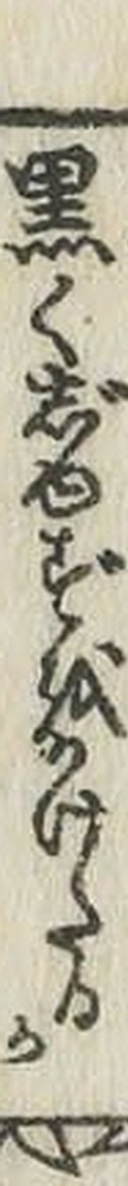黒くじゆずをかけたるか
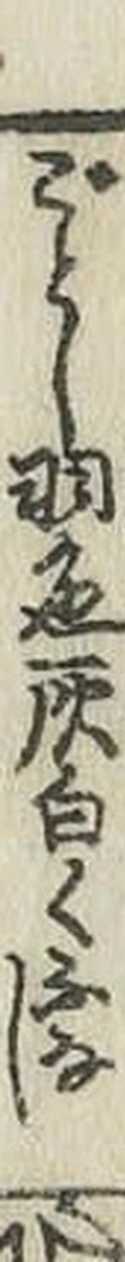ごとし羽色灰白くふなし
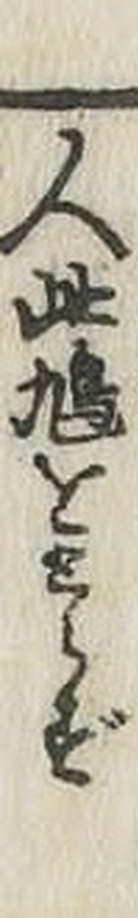人此鳩をとらず
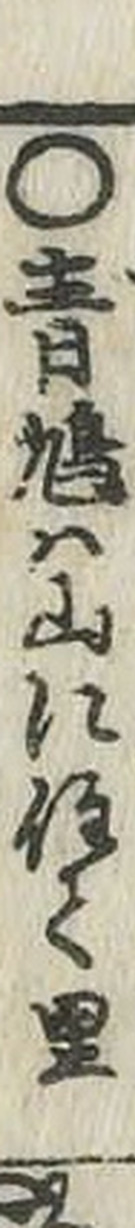○青鳩は山に住て里
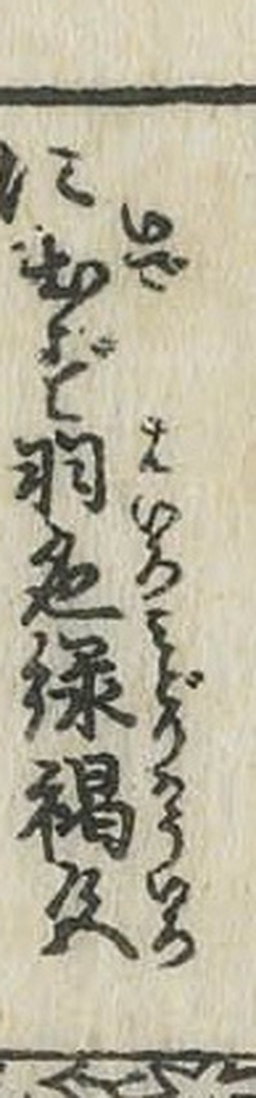に出ず羽色緑褐色
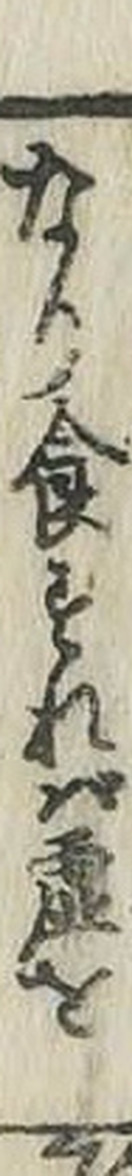なり食すれば虚を
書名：増補頭書訓蒙図彙大成 10巻 6:巻之12-13
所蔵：東京学芸大学教育コンテンツアーカイブ
